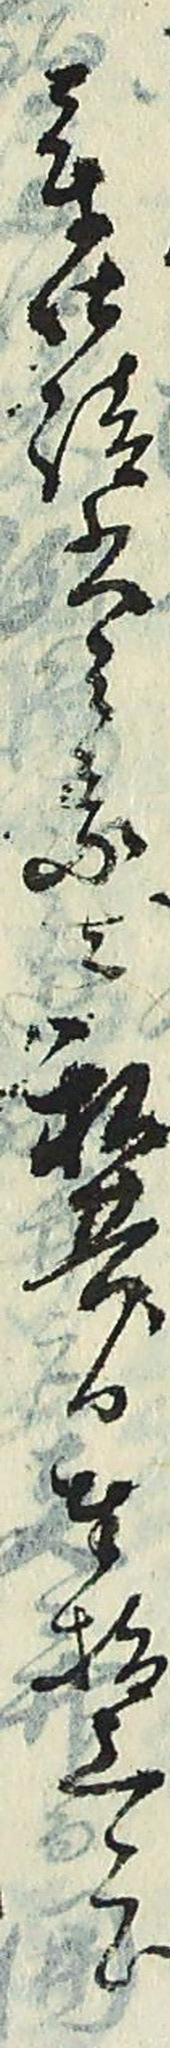に付御請書之義は私共ゟ奉指上候以上
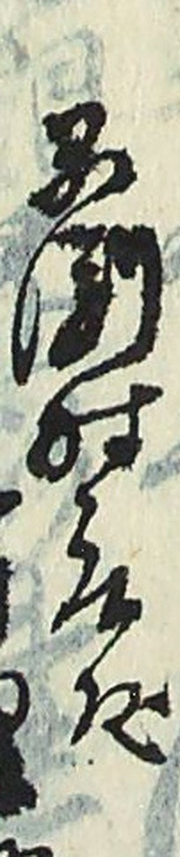早淵村庄屋
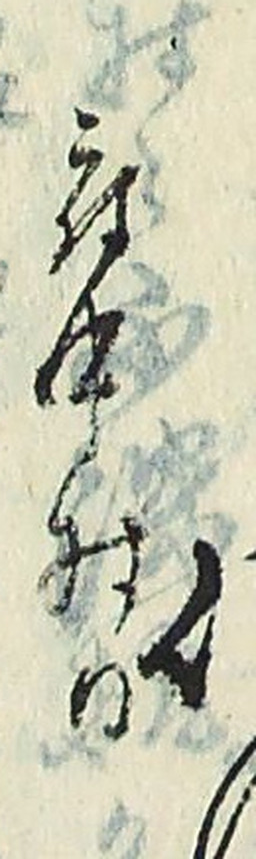府中村同
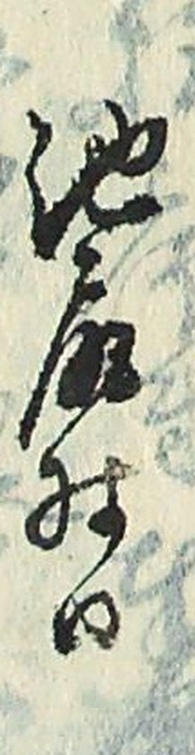池尻村同
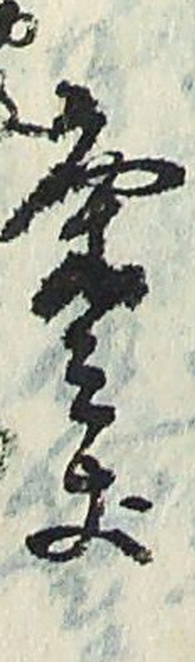粂之丈
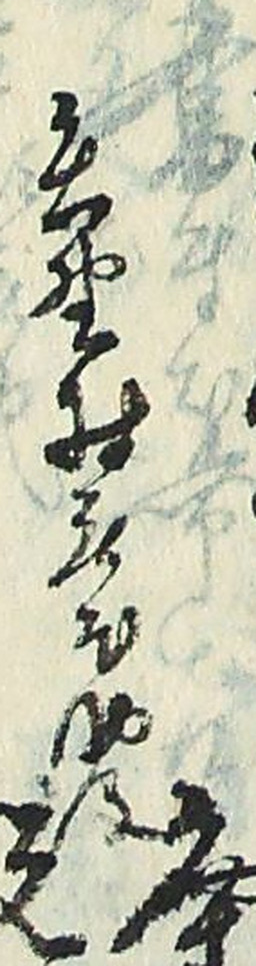矢野村庄屋助役
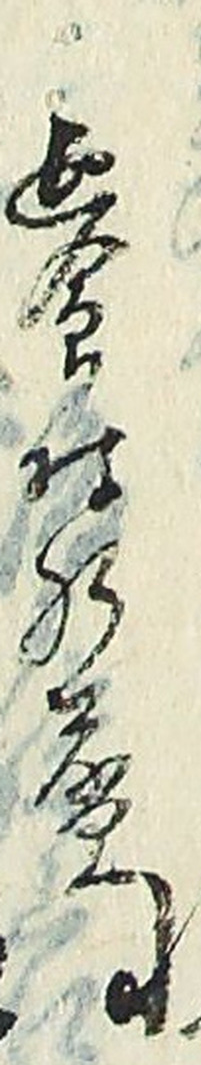延命村肝煎
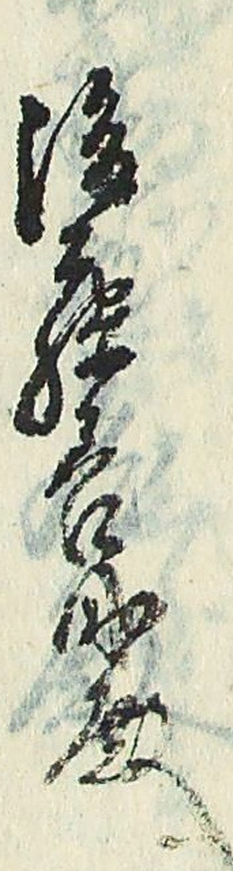後藤善助殿

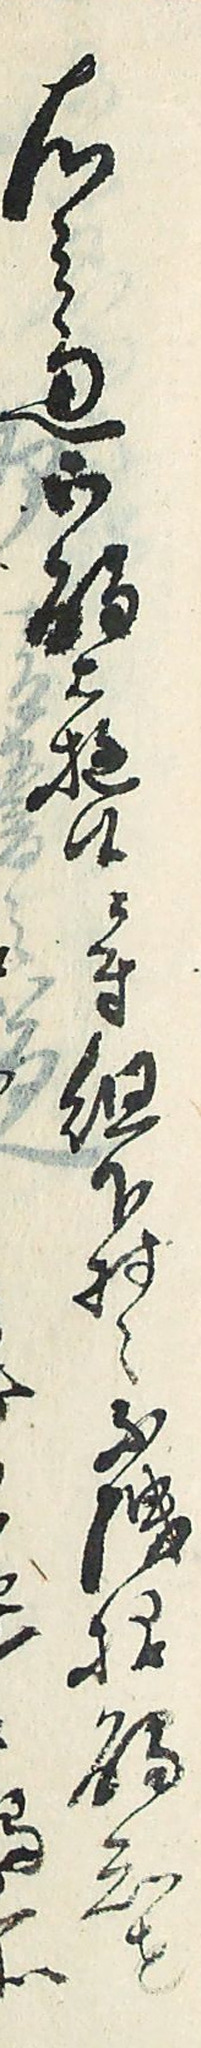右之通御触被遊候に付組下村々不洩様触知せ
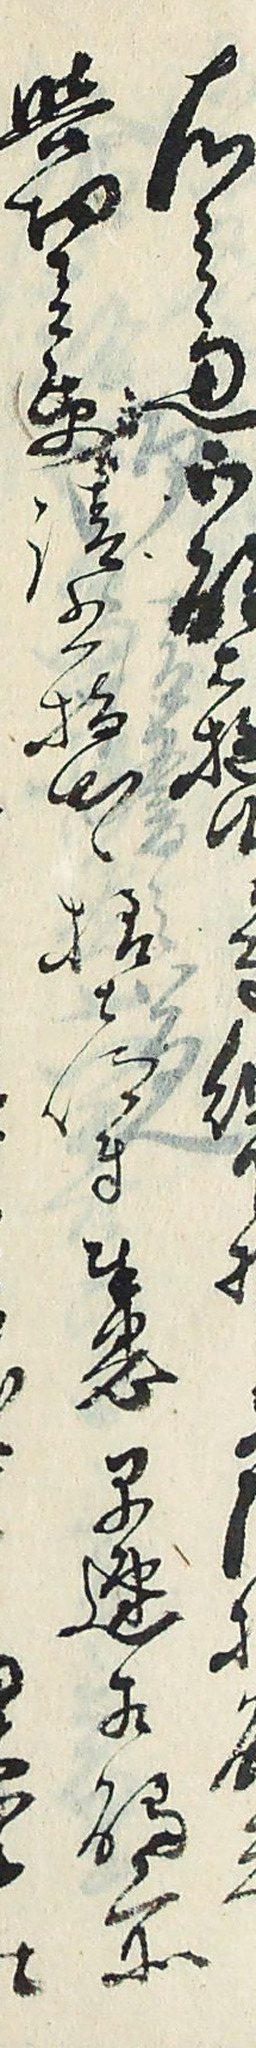与切壱帋請書可指出候様被仰付奉畏早速相触候所
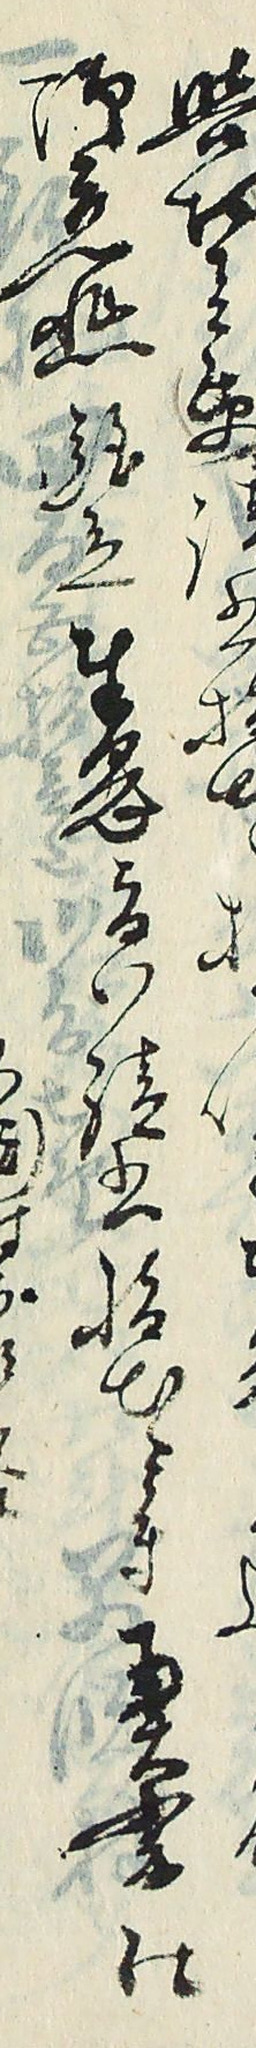御慈悲難有奉畏旨御請書指出候に付奥書仕
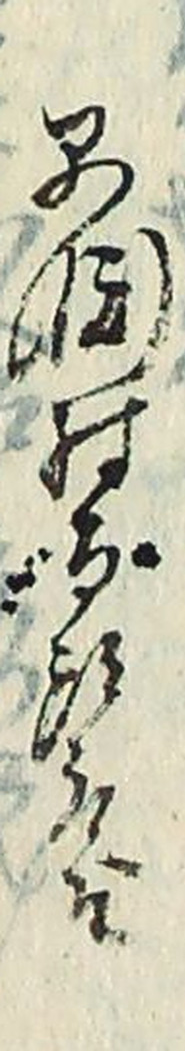早淵村与頭庄屋
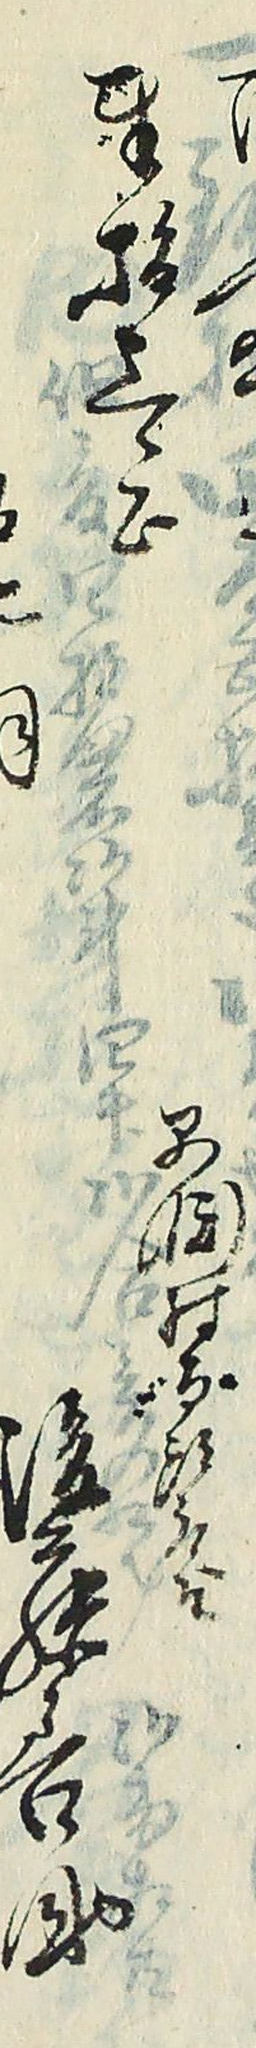奉指上候以上
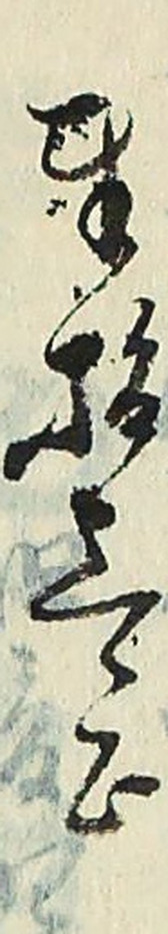奉指上候以上
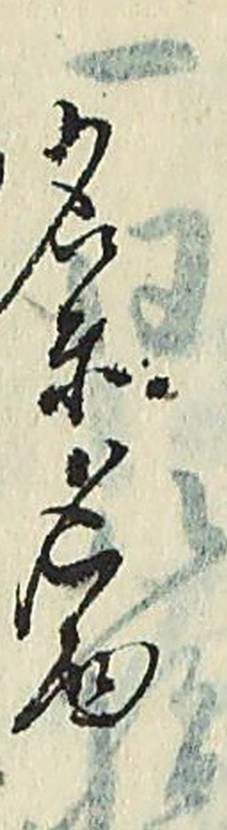名東名西
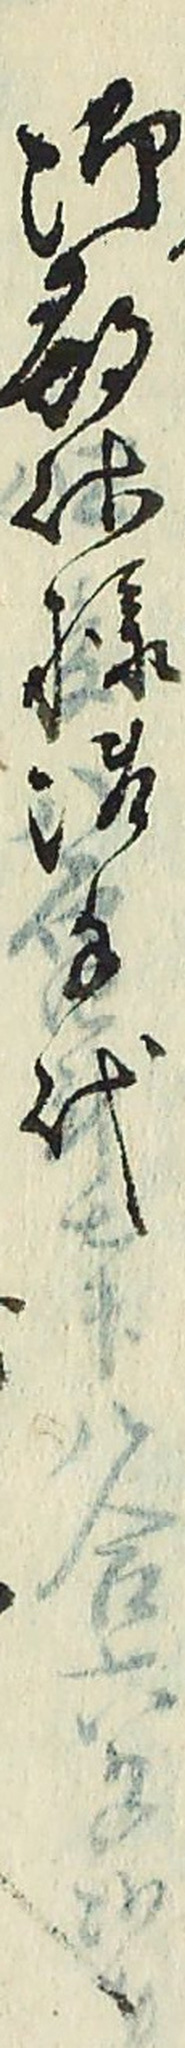御郡代様御手代
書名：諸御用御□受書控
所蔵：鳴門教育大学 Naruto University of Education
